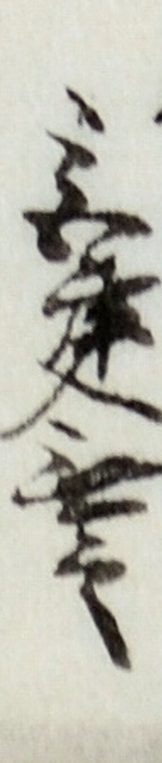宮建無之
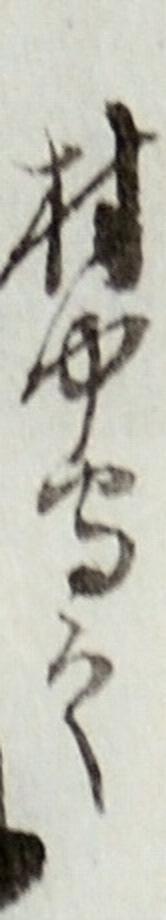村中守之
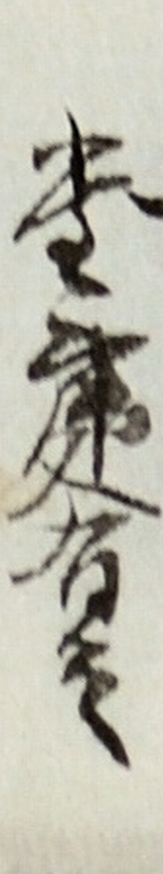宮建有之
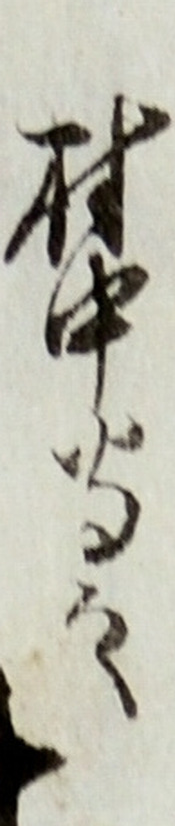村中守之
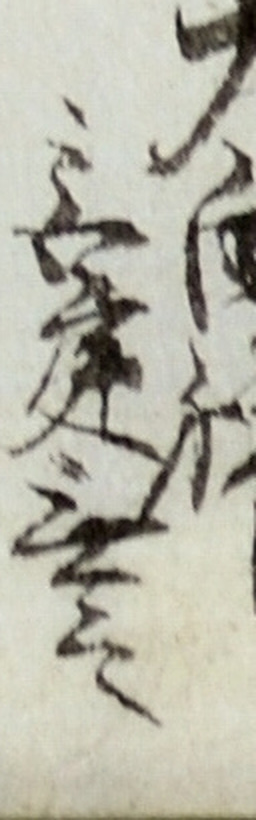宮建無之
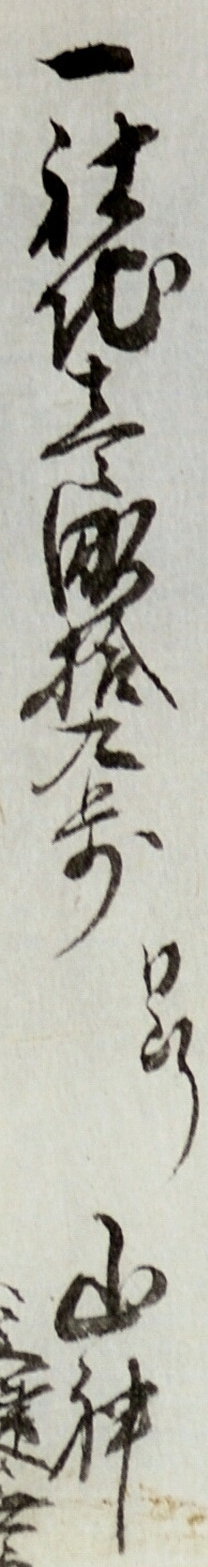一社地壱畝拾九歩山神
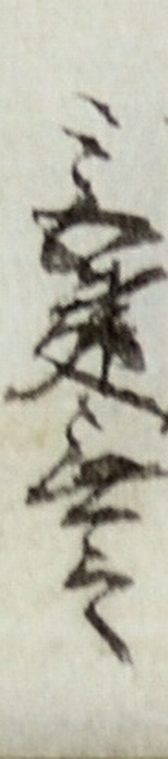宮建無之

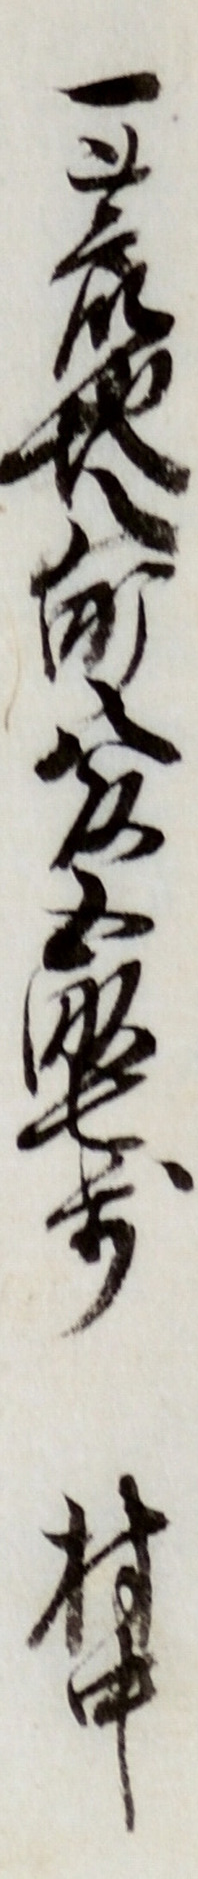一荒地八町八反五畝七歩村中
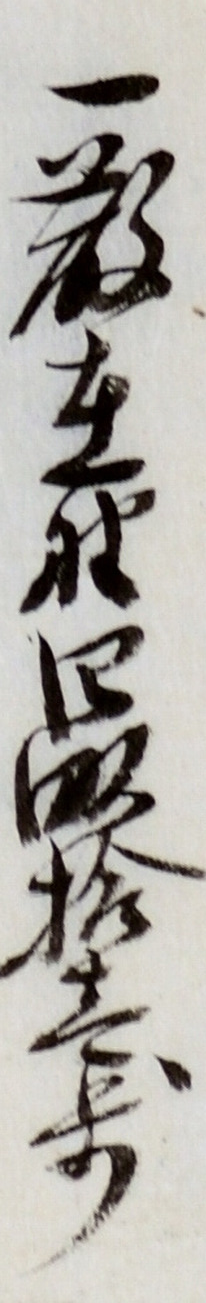一散在野四畝拾壱歩
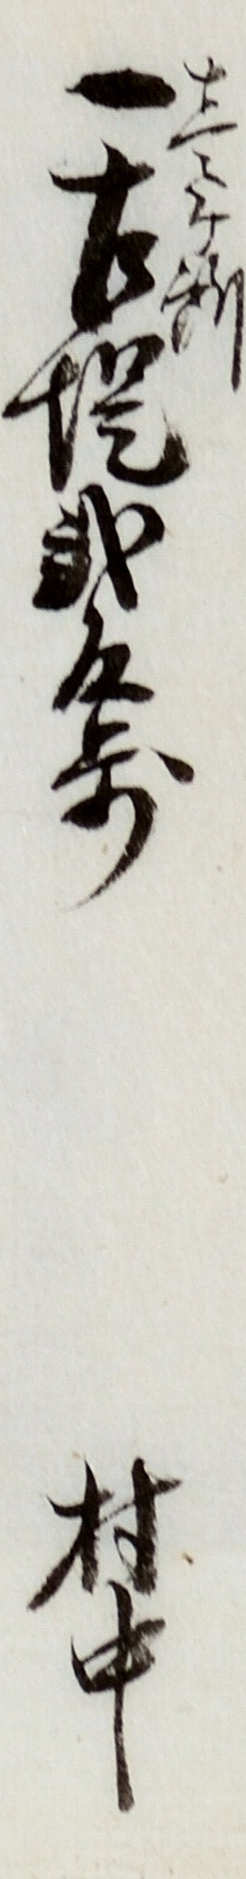一古堤弐反歩村中
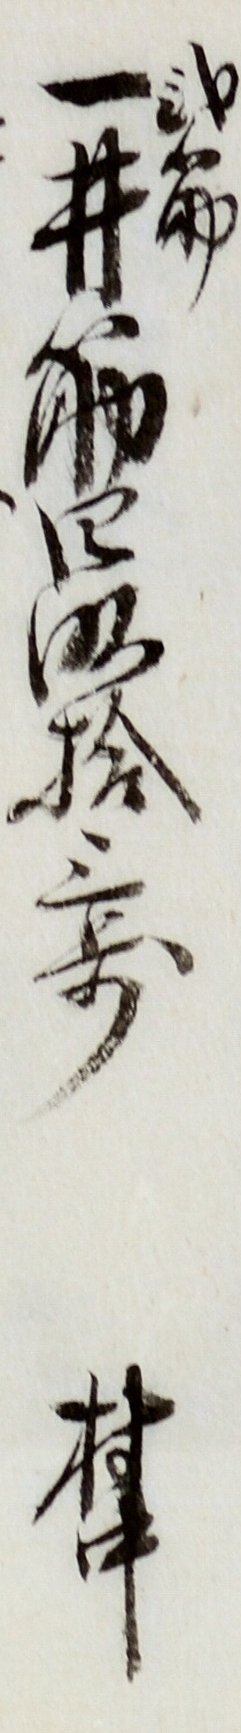一井筋四畝拾三歩村中
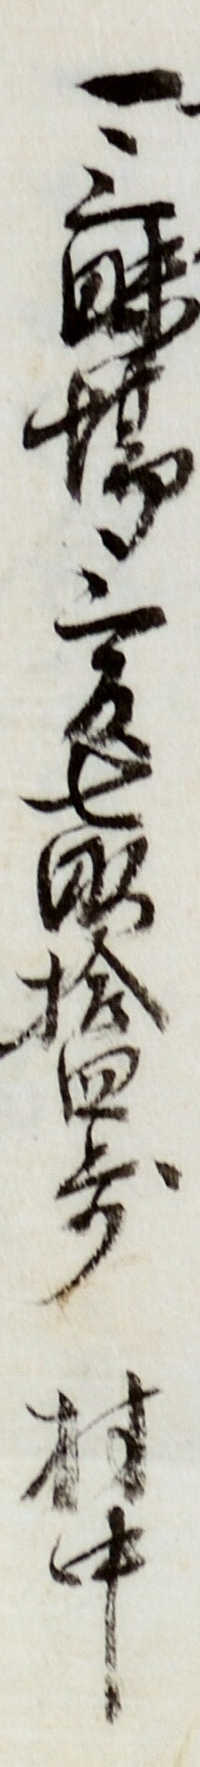一三昧場三反七畝拾四歩村中
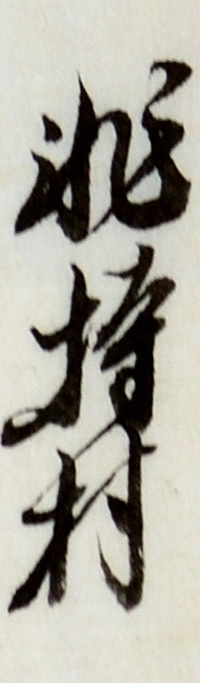非持村
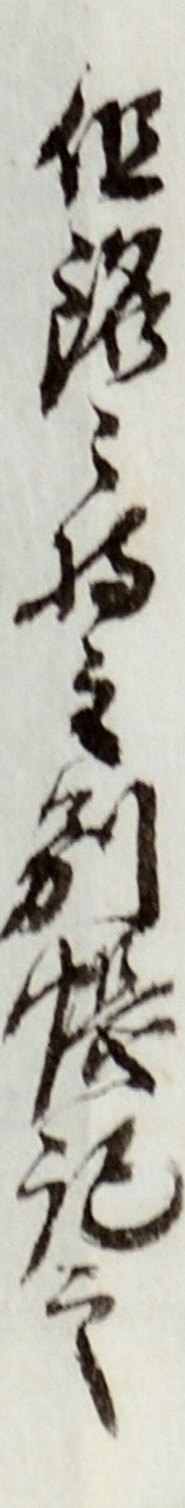但銘々持主別帳記之
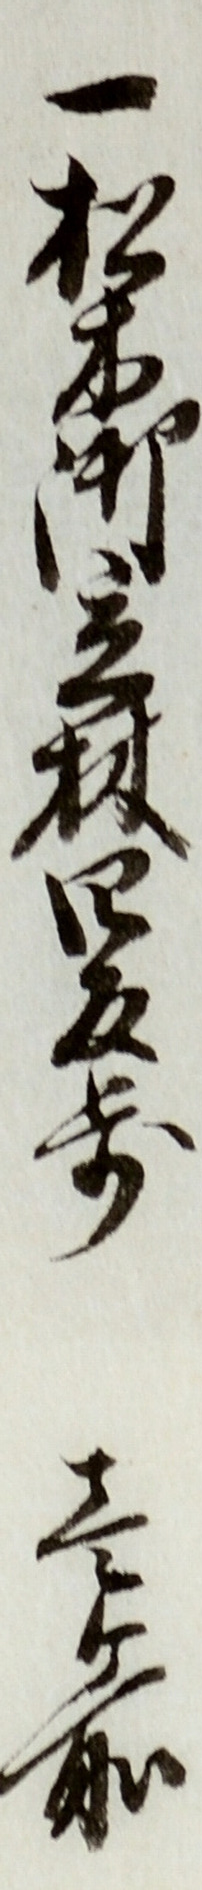一松木御立林四反歩壱ケ所
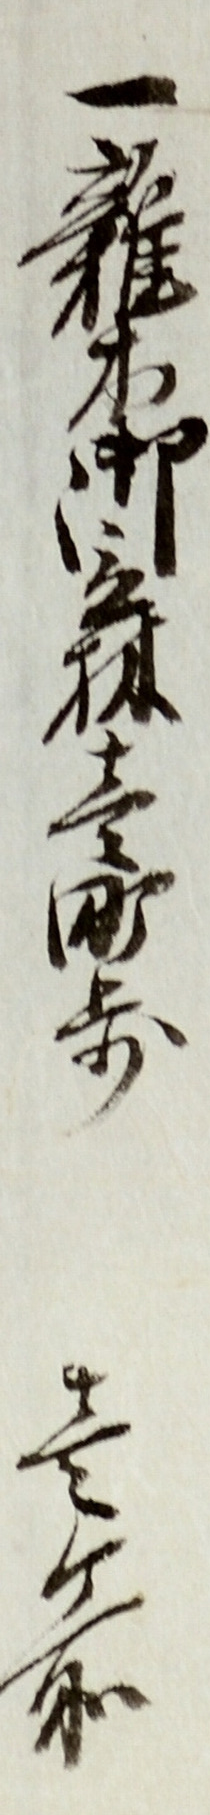一雑木御立林壱町歩壱ケ所
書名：御領分中山林社地手控
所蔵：伊那市立高遠町図書館・合同会社AMANE
